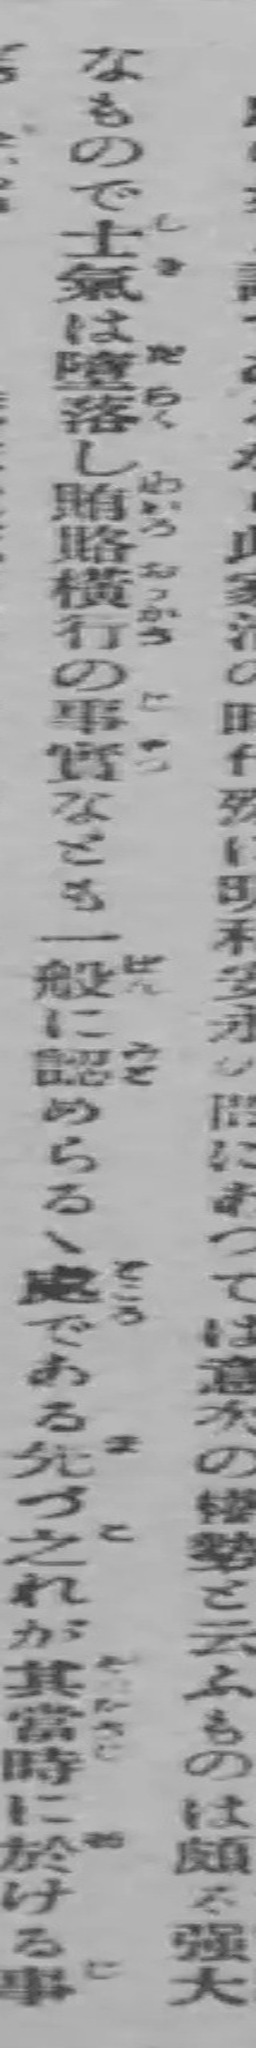なもので士気は堕落し賄賂横行の事実なとも一般に認めらるゝ処である先づ之れが其当時に於ける事
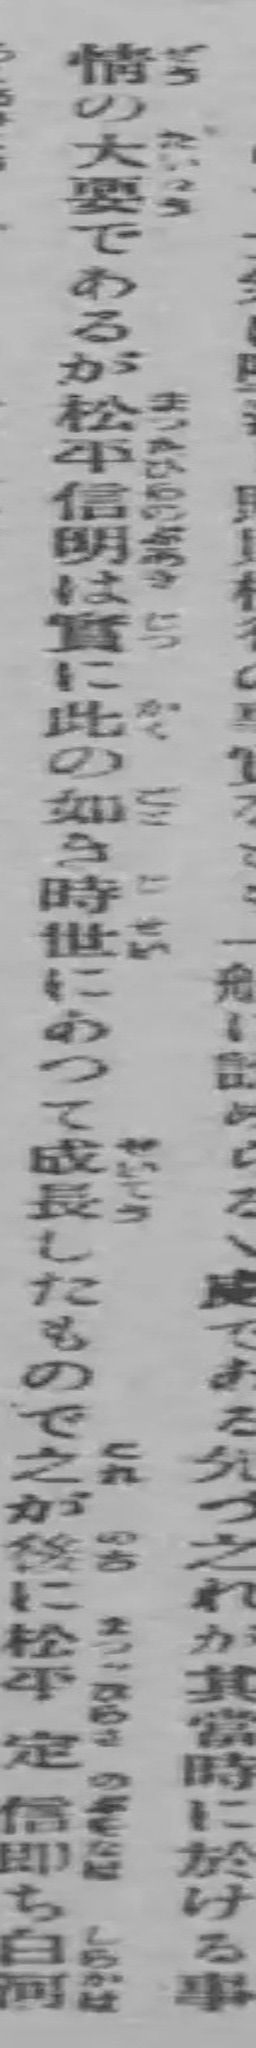情の大要であるが松平信明は実に此の如き時世にあつて成長したもので之が後に松平定信即ち白河
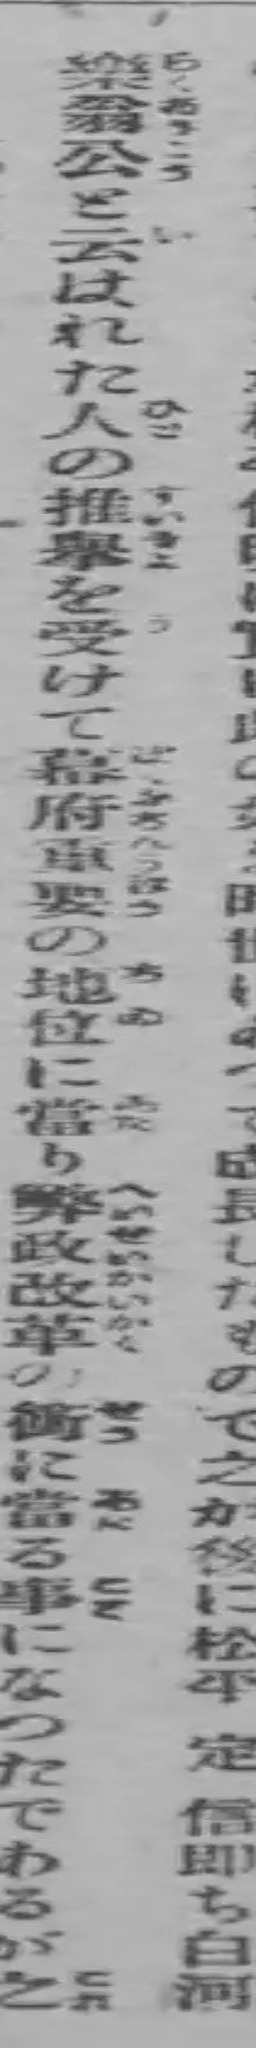楽翁公と云はれた人の推挙を受けて幕府重要の地位に当り弊政改革の衝に当る事になつたのであるが之
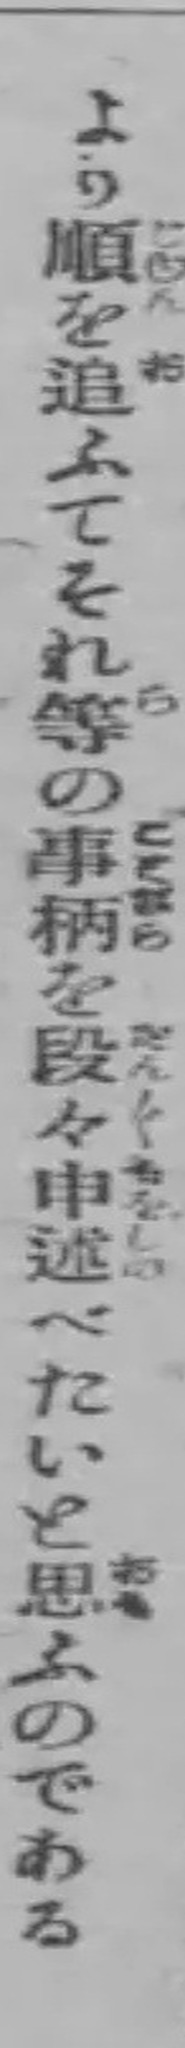より順を追ふてそれ等の事柄を段々申述べたいと思ふのである
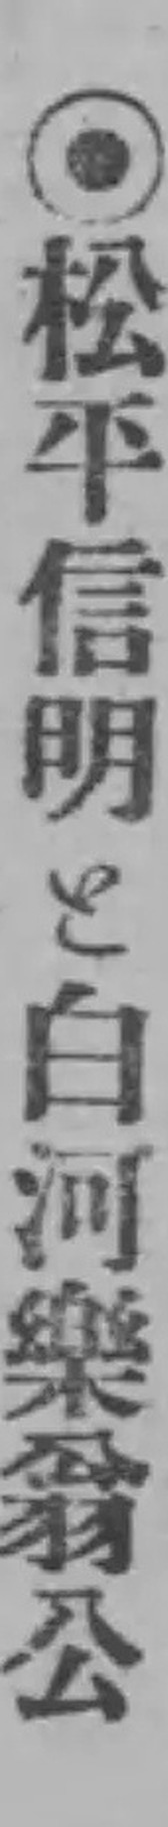⦿松平信明と白河楽翁公
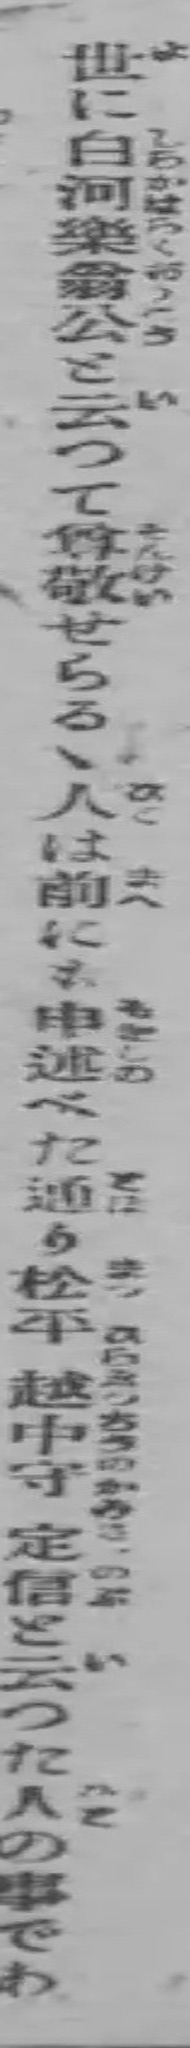松平定信世に白河楽翁公と云つて尊敬せらるゝ人は前にも申述べた通り松平越中守定信と云つた人の事であ
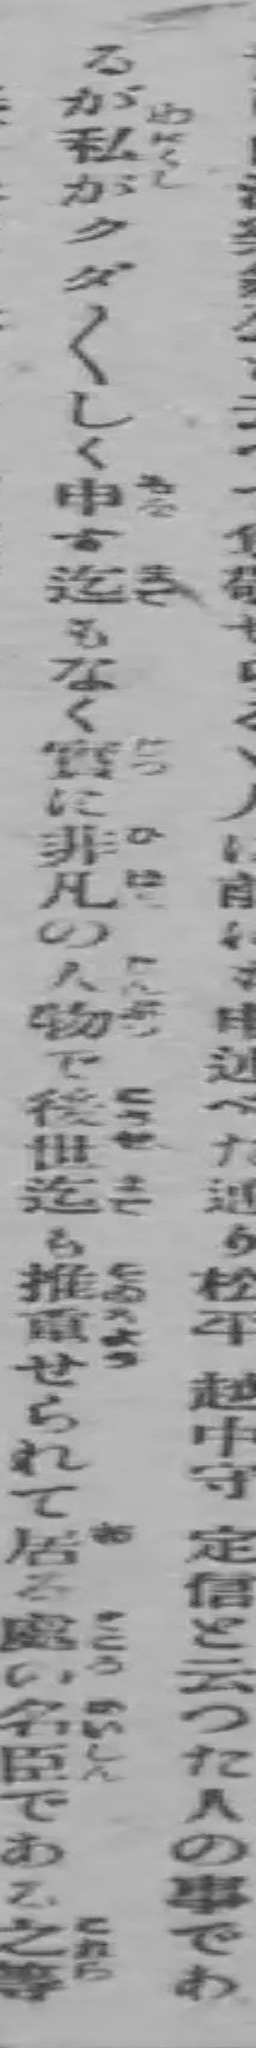るが私がクダ〳〵しく申す迄もなく実に非凡の人物で後世迄も推重せられて居る処の名臣である之等
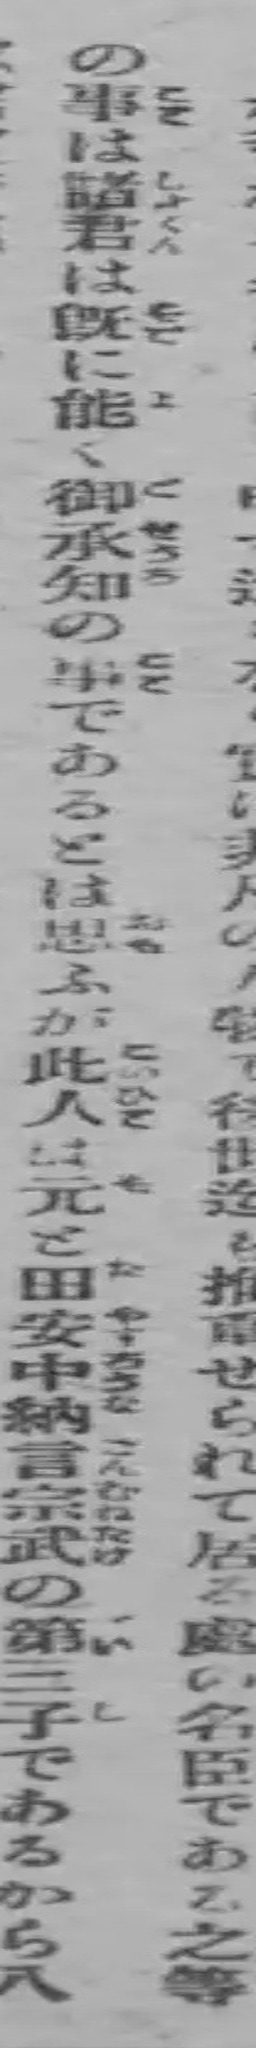の事は諸君は既に能く御承知の事であるとは思ふが此人は元と田安中納言宗武の第三子であるから八
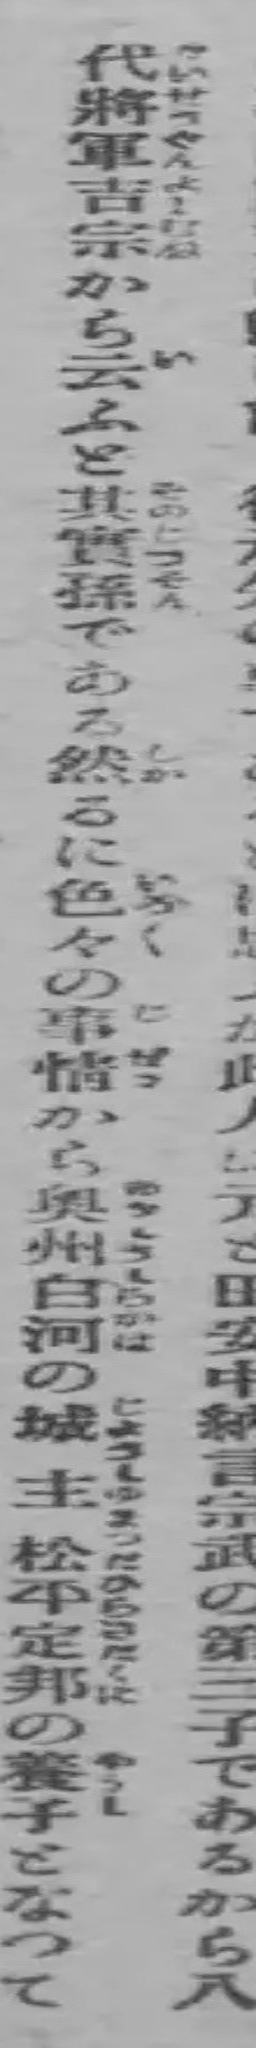代将軍吉宗から云ふと其実孫である然るに色々の事情から奥州白河の城主松平定邦の養子となつて
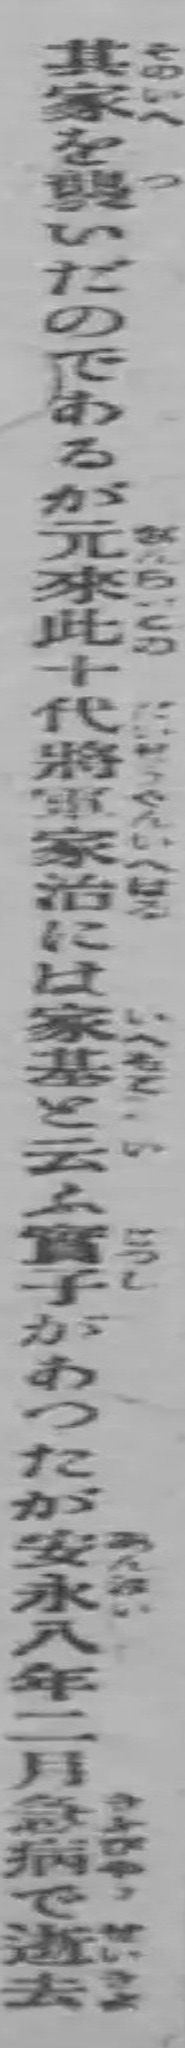其家を襲いだのであるが元来此十代将軍家治には家基と云ふ実子があつたが安永八年二月急病で逝去
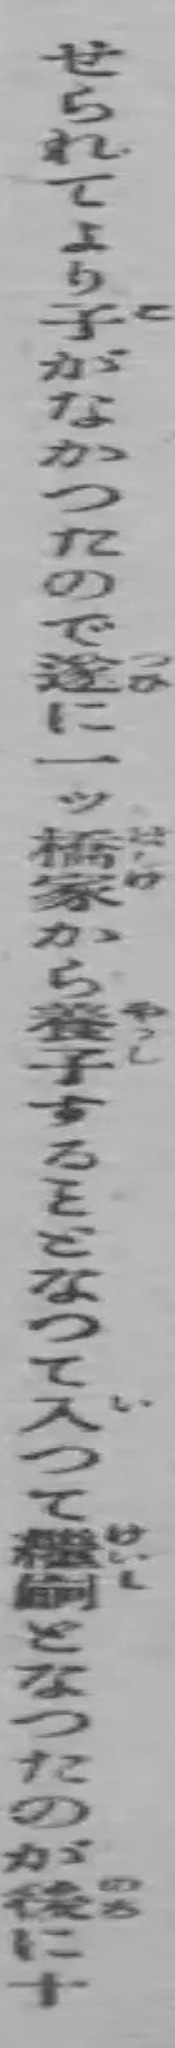せられてより子がなかつたので遂に一ツ橋家から養子することとなつて入つて継嗣となつたのが後に十
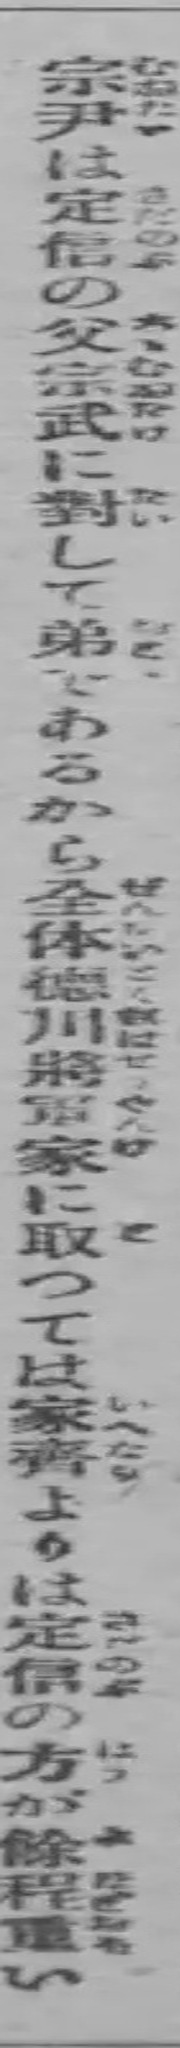宗尹は定信の父宗武に対して弟であるから全体徳川将軍家に取つては家斉よりは定信の方が余程重い
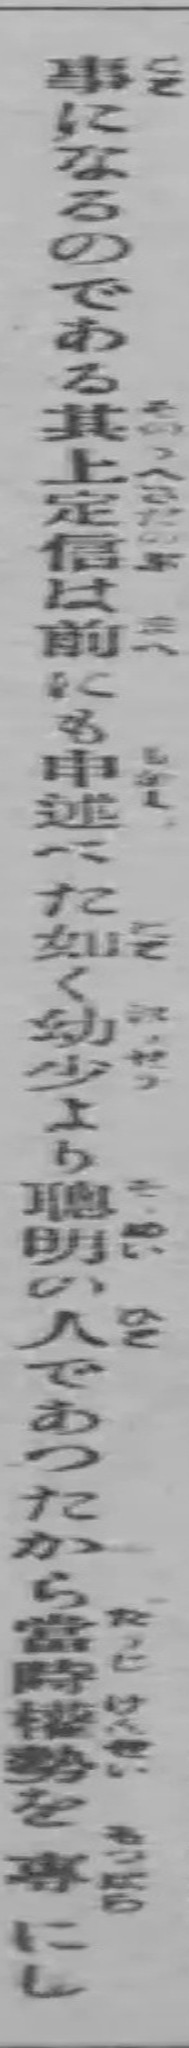事になるのである其上定信は前にも申述べた如く幼少より聡明の人であつたから当時権勢を専にし
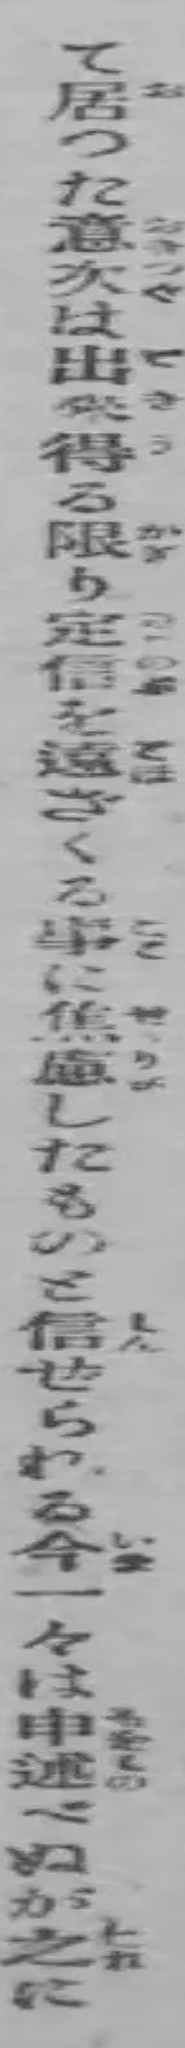て居つた意次は出来得る限り定信を遠ざくる事に焦慮したものと信ぜられる今一々は申述べぬが之に
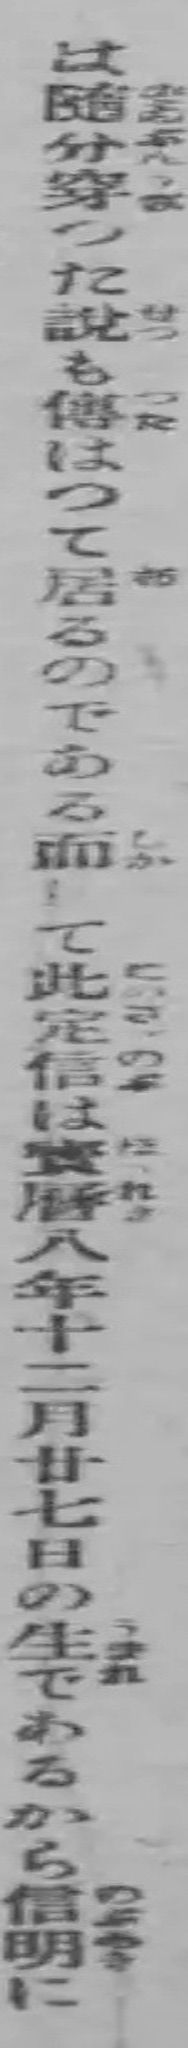は随分穿つた説も伝はつて居るのである而して此定信は宝暦八年十二月廿七日の生であるから信明に
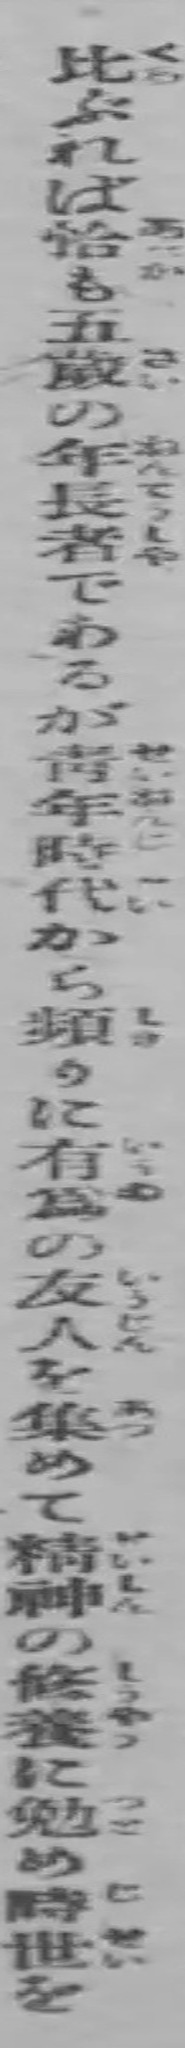比ぶれば恰も五歳の年長者であるが青年時代から頻りに有為の友人を集めて精神の修養に勉め時世を
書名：豊橋市史談
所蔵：国立国会図書館 National Diet Library, JAPAN
